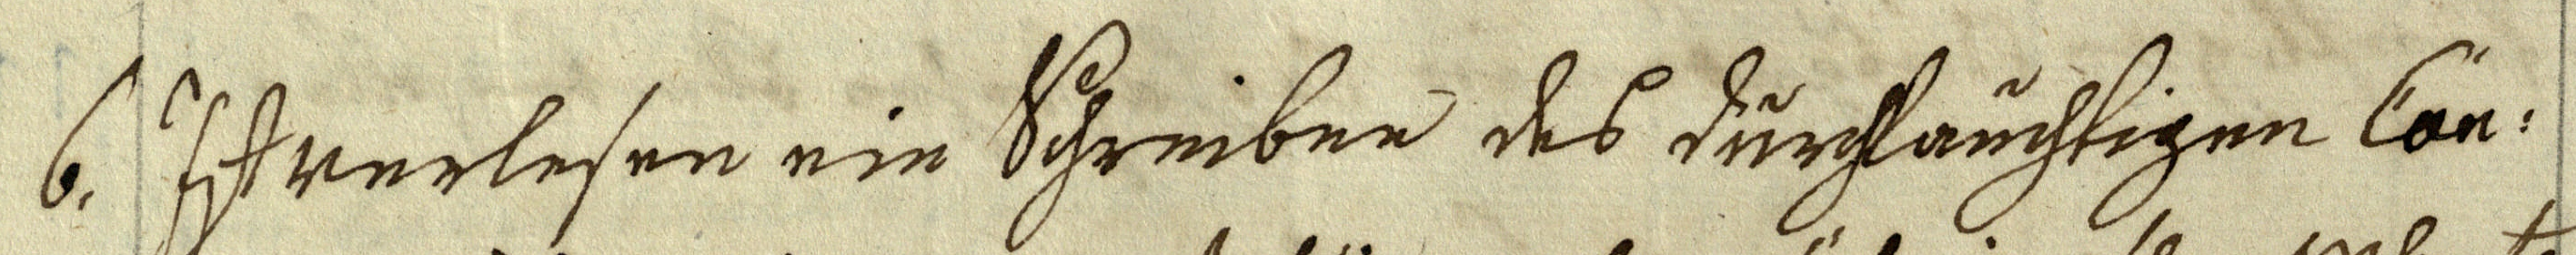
6. Ist verlesen ein Schreiben des Durchlauchtigen Can¬
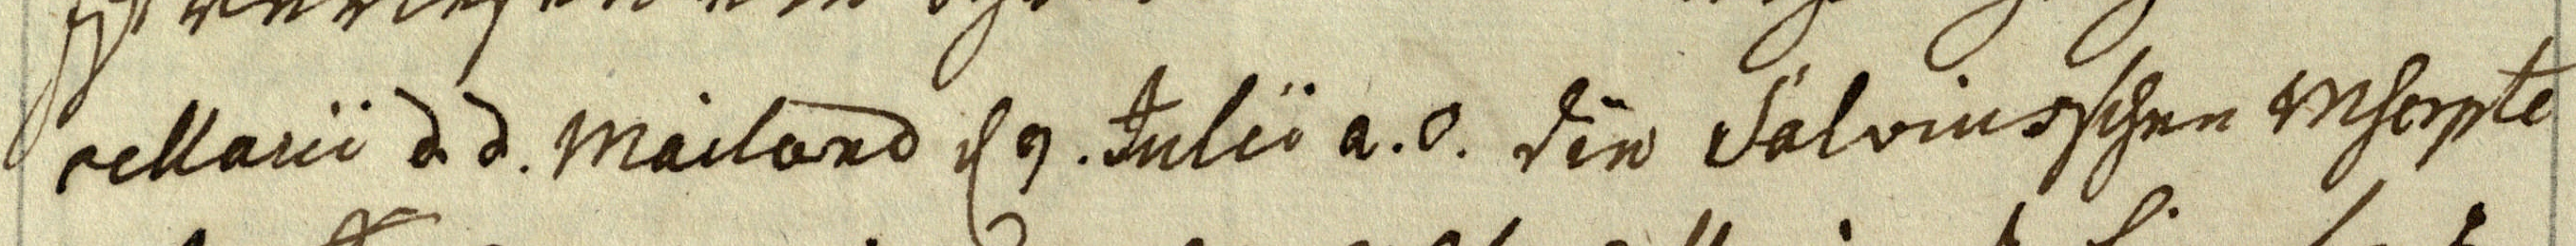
cellarii d. d. Mailand d. 9. Julii a. o. die Salviusschen rescripte
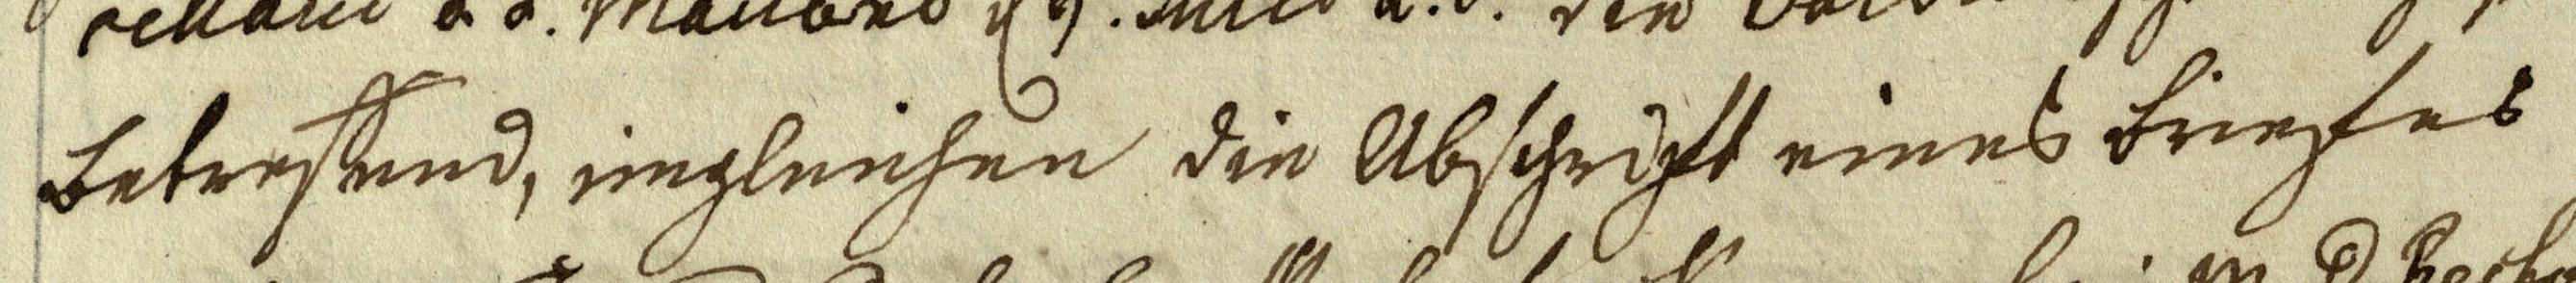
betreffend, imgleichen die Abschrift eines Briefes
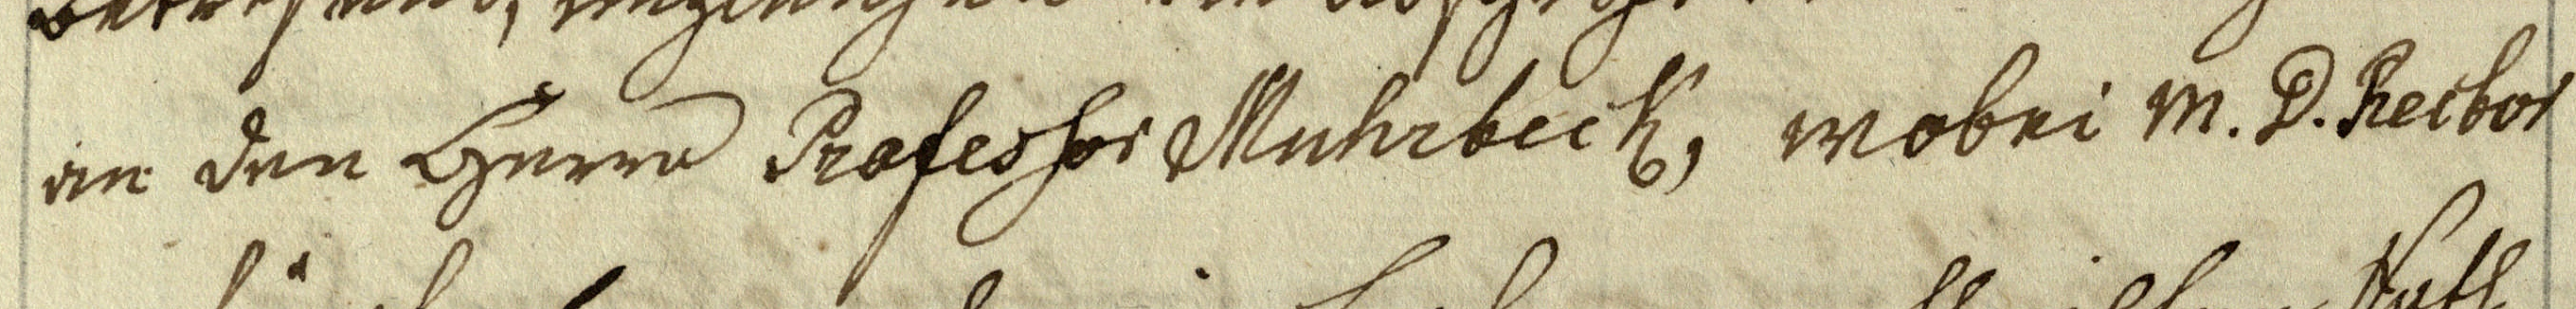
an den Herrn Professor Muhrbeck, wobei M. D. Rector
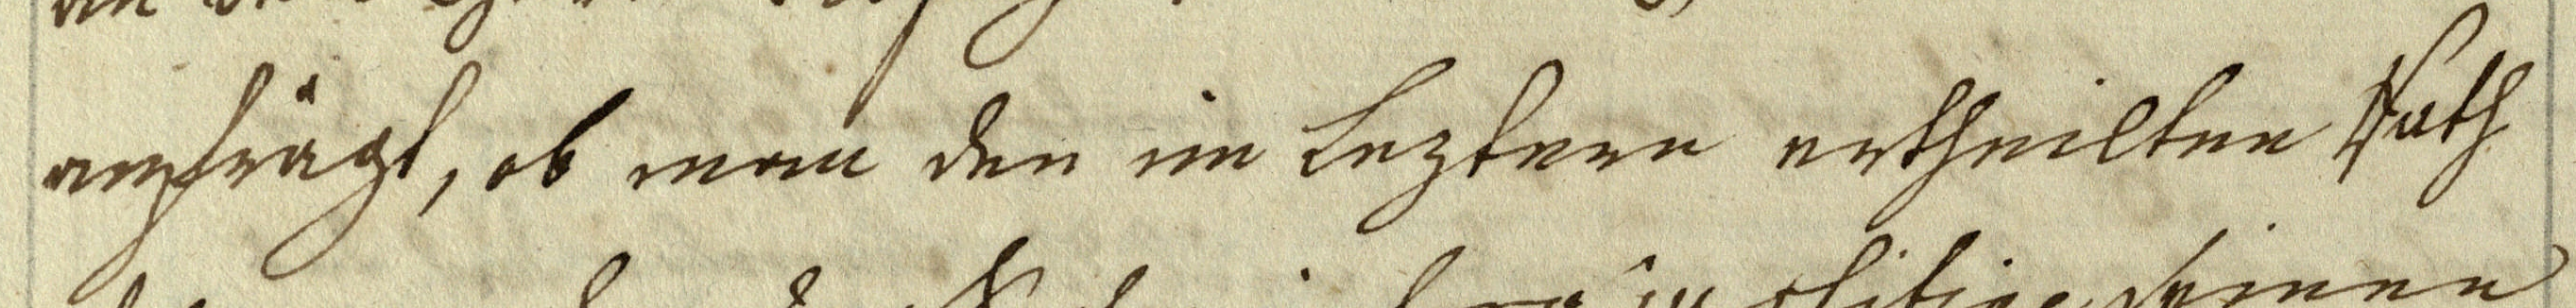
anfrägt, ob man den im Leztern ertheilten Rath
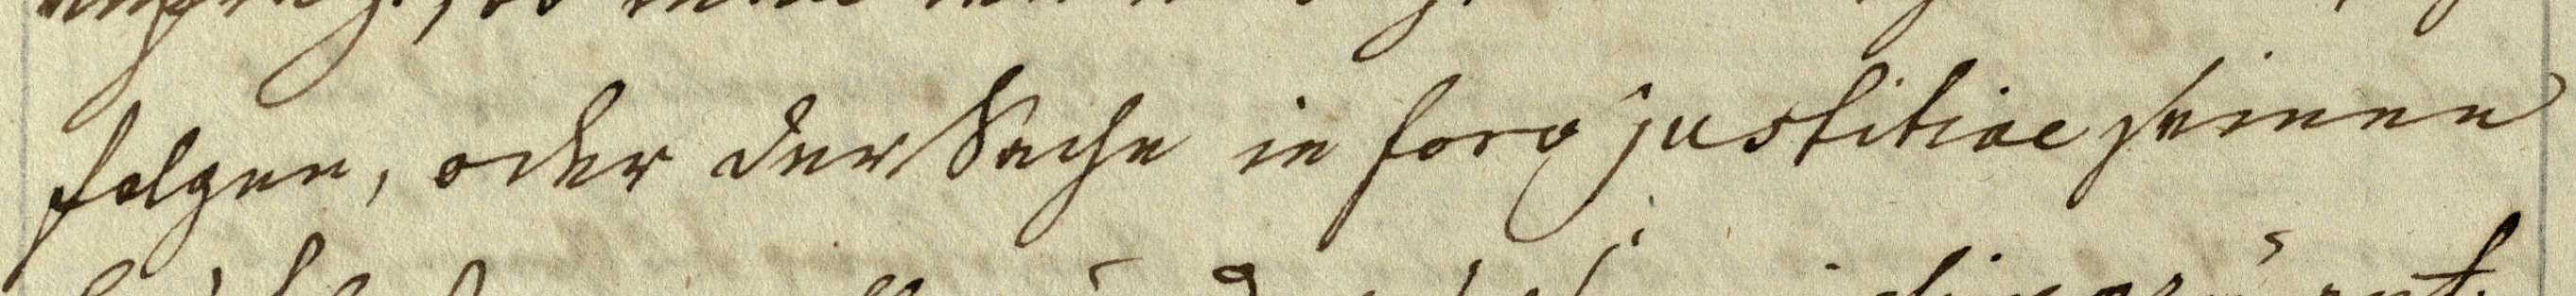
folgen, oder der Sache in foro justitiae seinen
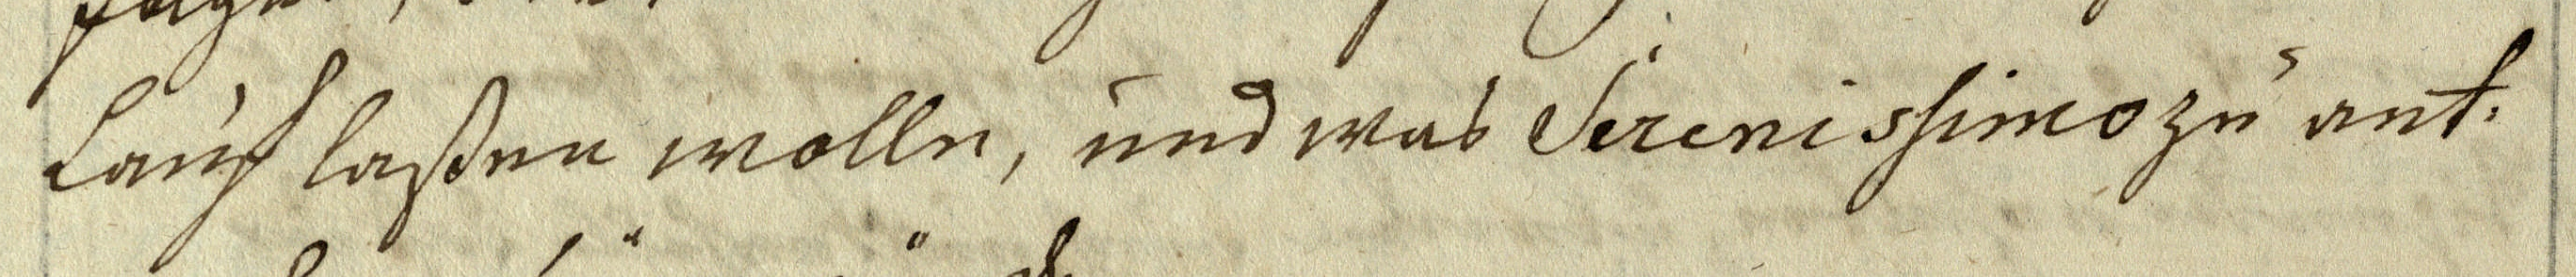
Lauf laßen wolle, und was Serenissimo zu ant¬
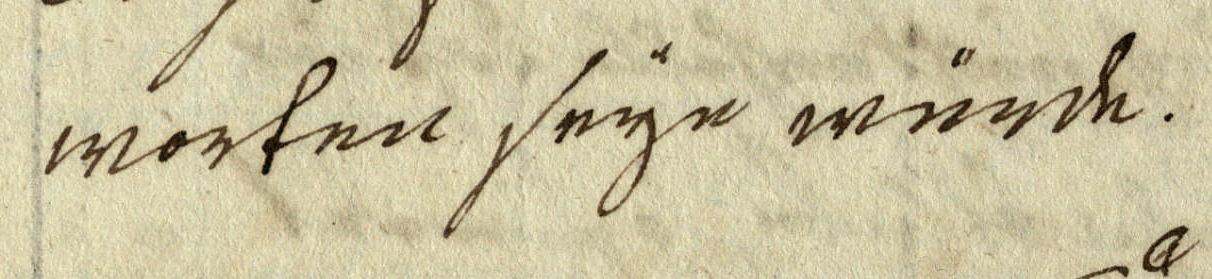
worten seÿn würde.
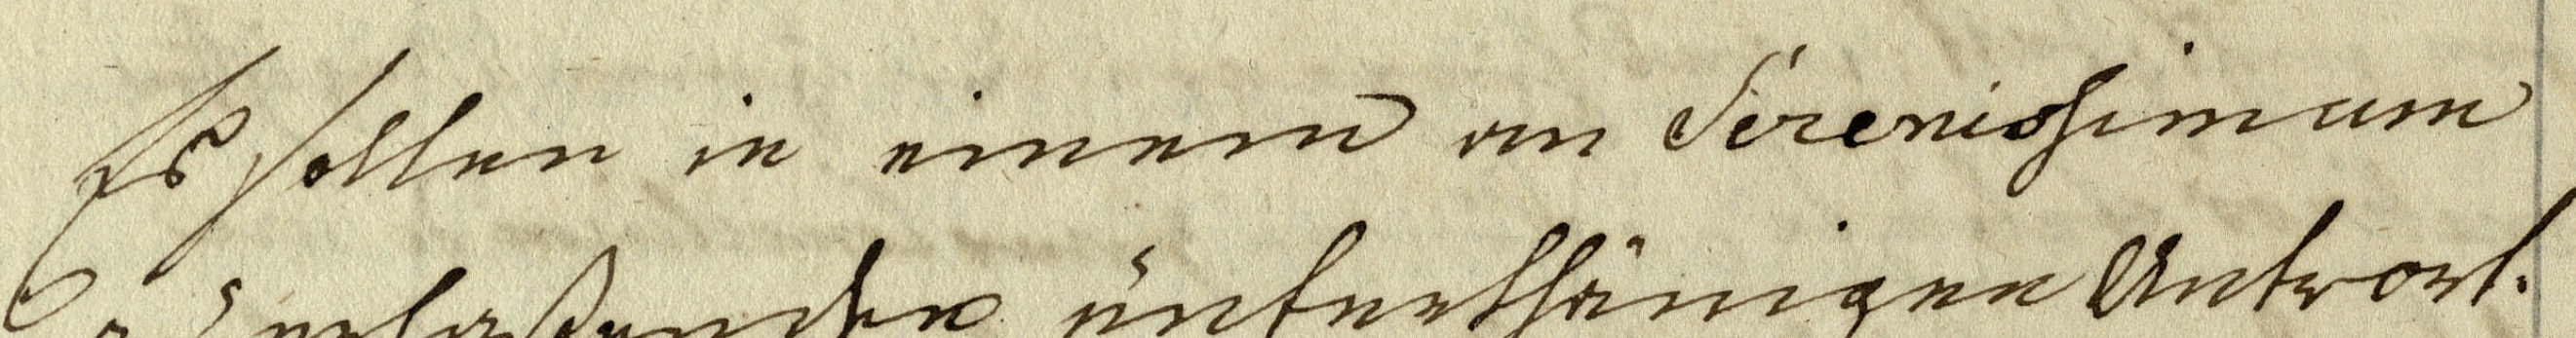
Es sollen in einem an Serenissimum
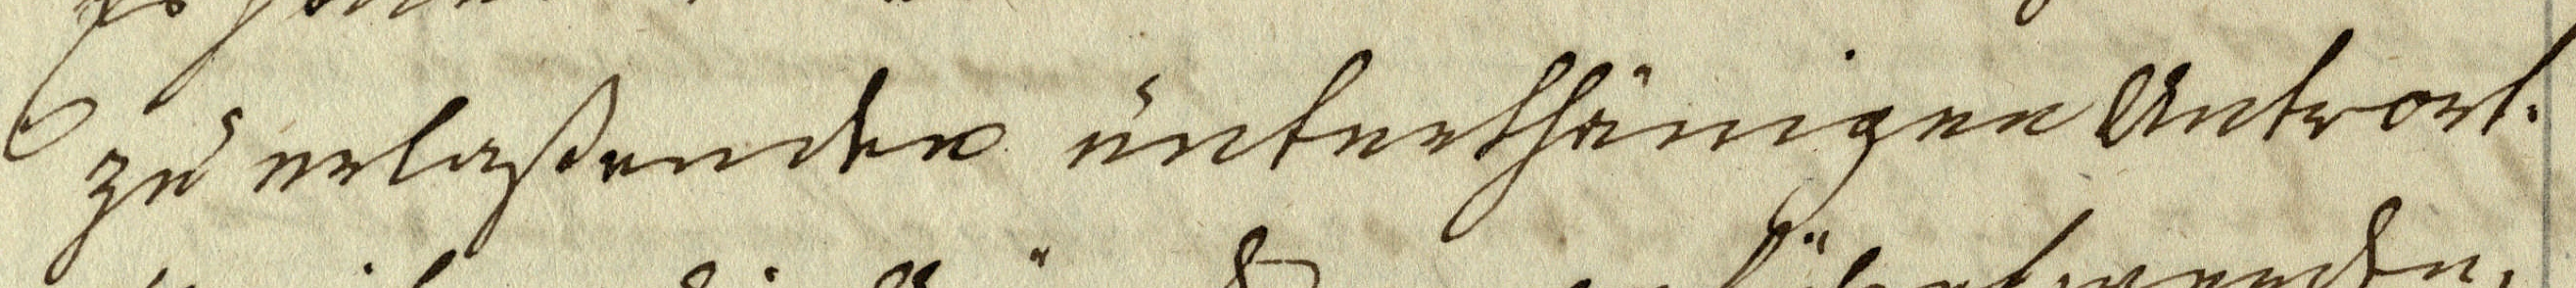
zu erlaßenden unterthänigen Antwort¬
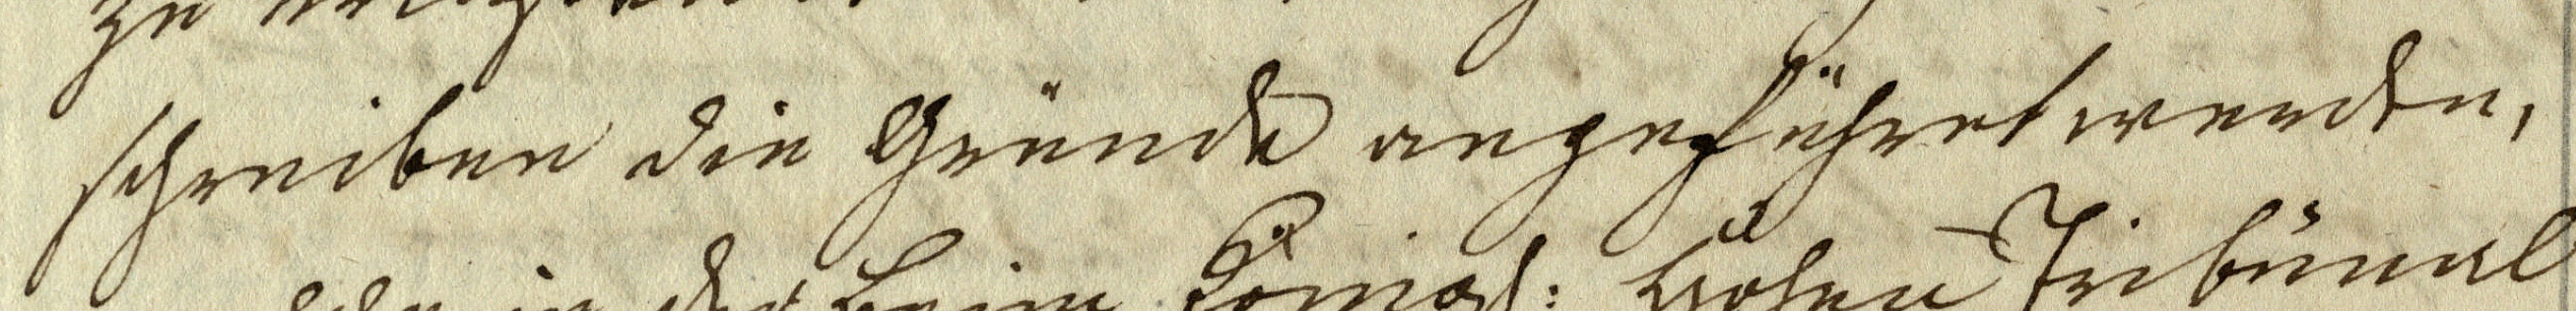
schreiben die Gründe angeführet werden,
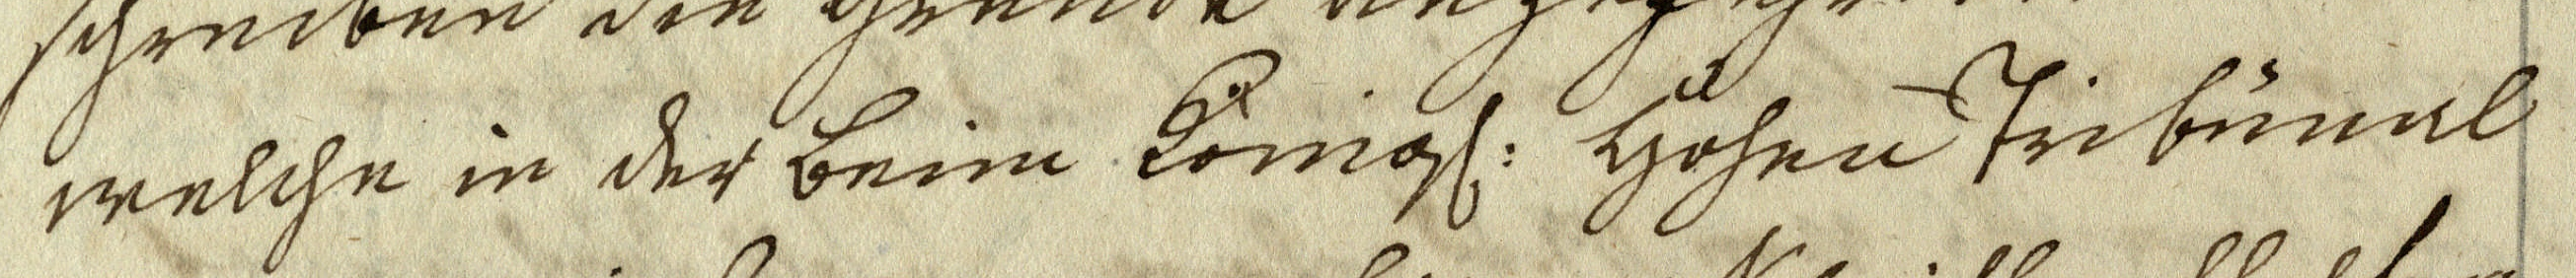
welche in der beim Königl. Hohen Tribunal
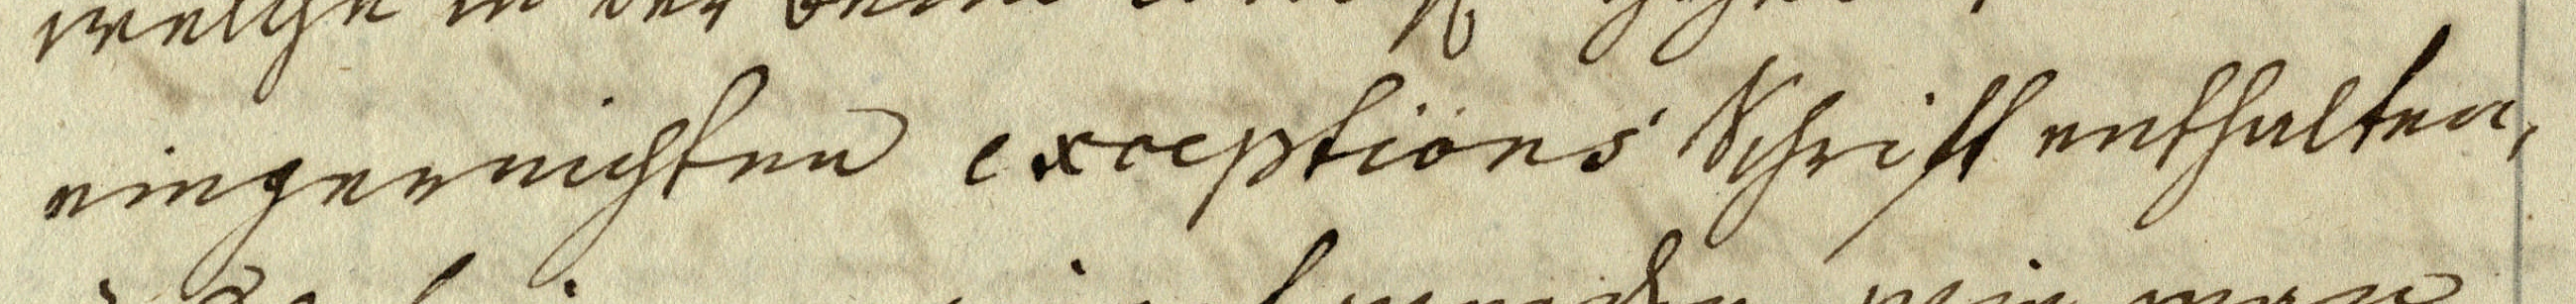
eingereichten exceptions Schrift enthalten,
